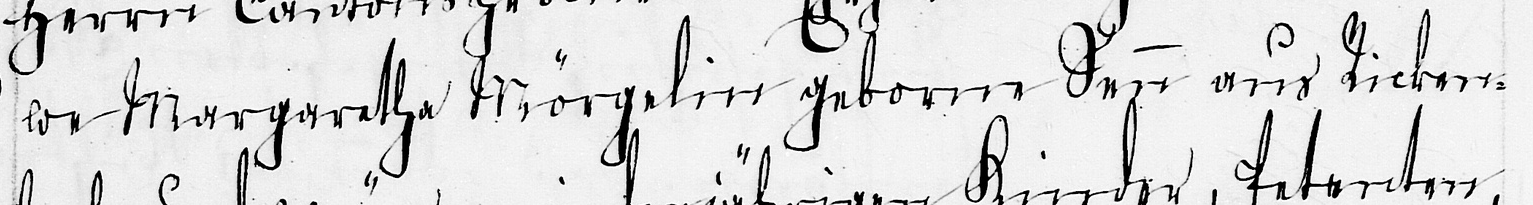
we Margaretha Mörgelin geborne Senn aus Ricken¬
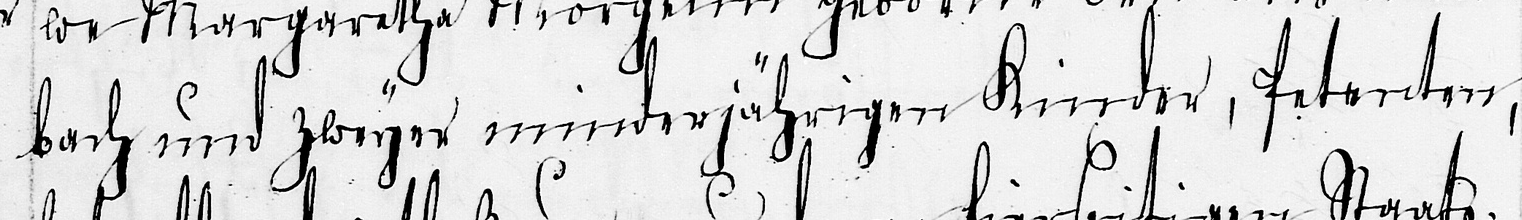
bach und zweyer minderjährigen Kinder, Petenten,
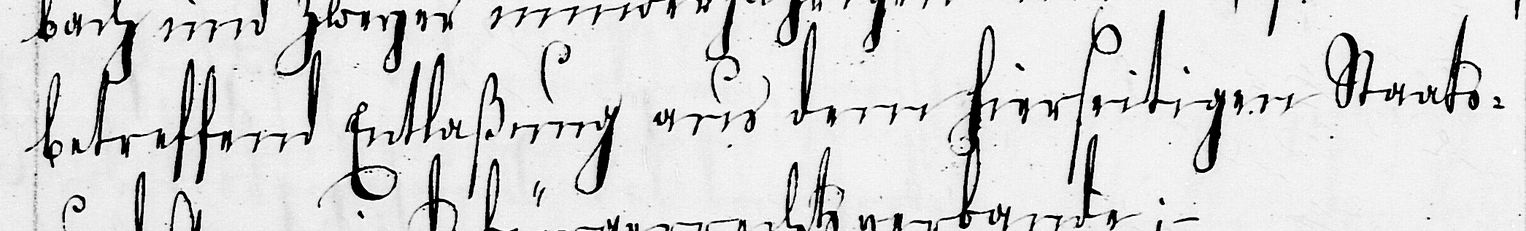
betreffend Entlaßung aus dem hierseitigen Staats-
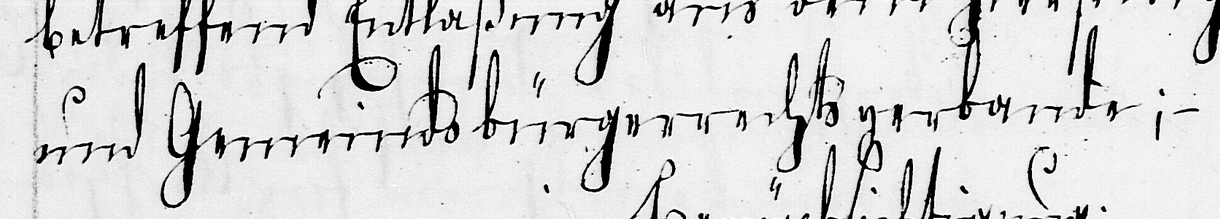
und Gemeindsbürgerrechtsverbande;
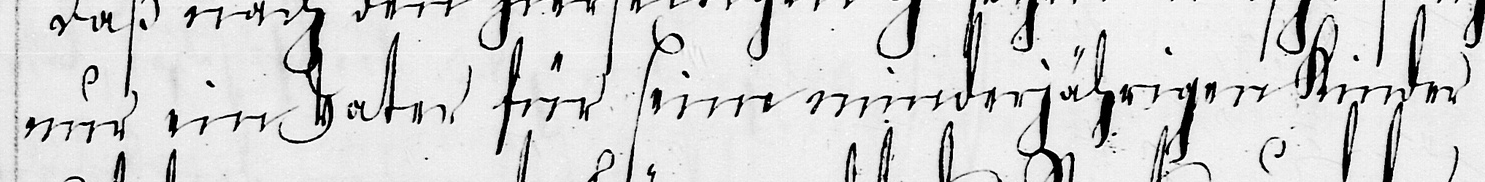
nur ein Vater für seine minderjährigen Kinder
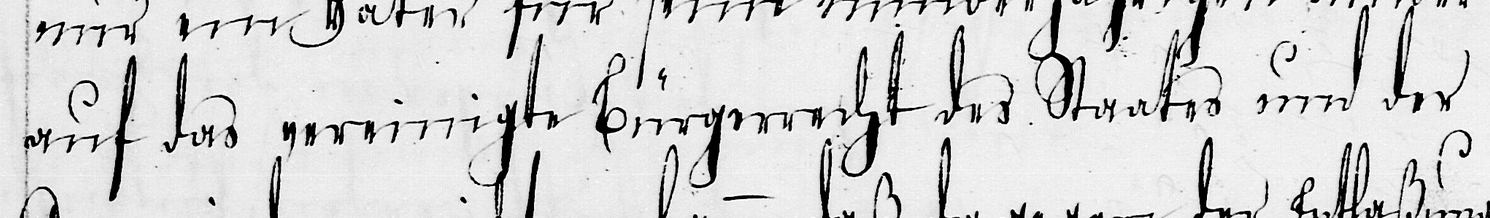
auf das vereinigte Bürgerrecht des Staates und der
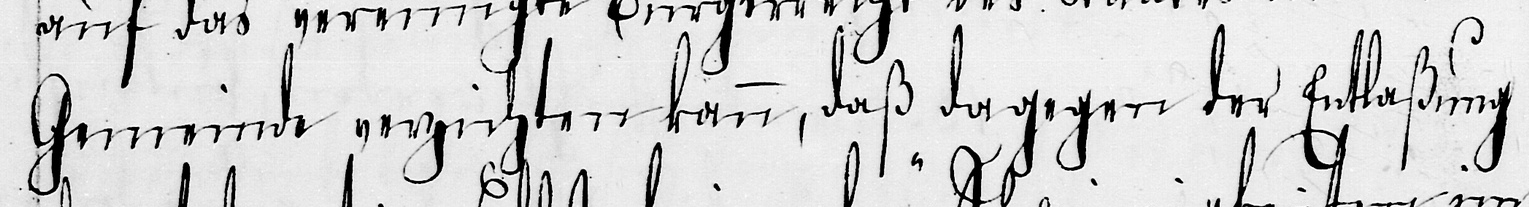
Gemeinde verzichten kann, daß dagegen der Entlaßung
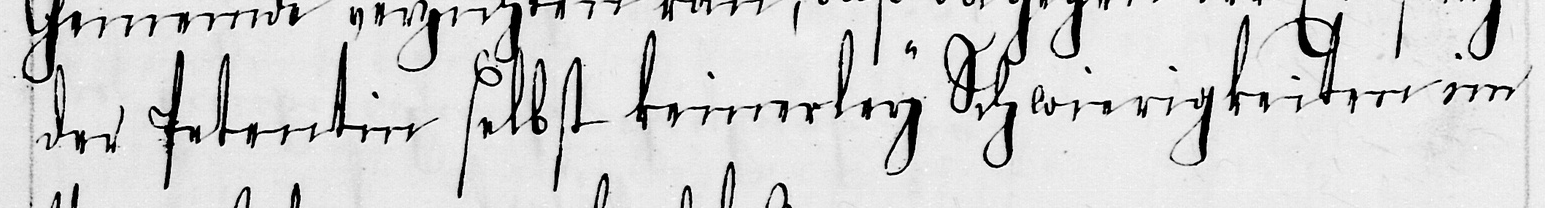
der Petentin selbst keinerley Schwierigkeiten im
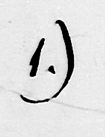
1.
